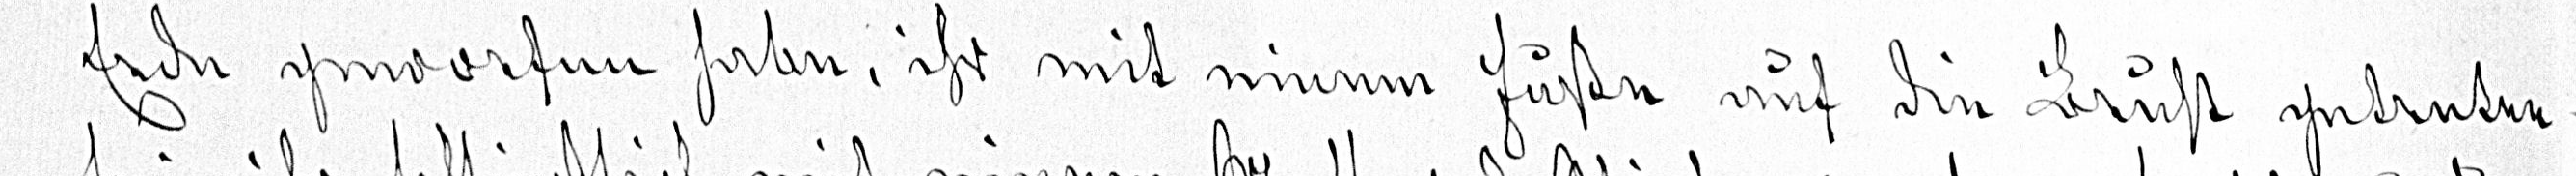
Erde geworfen habe, ihr mit einem fuße auf die Brust getreten
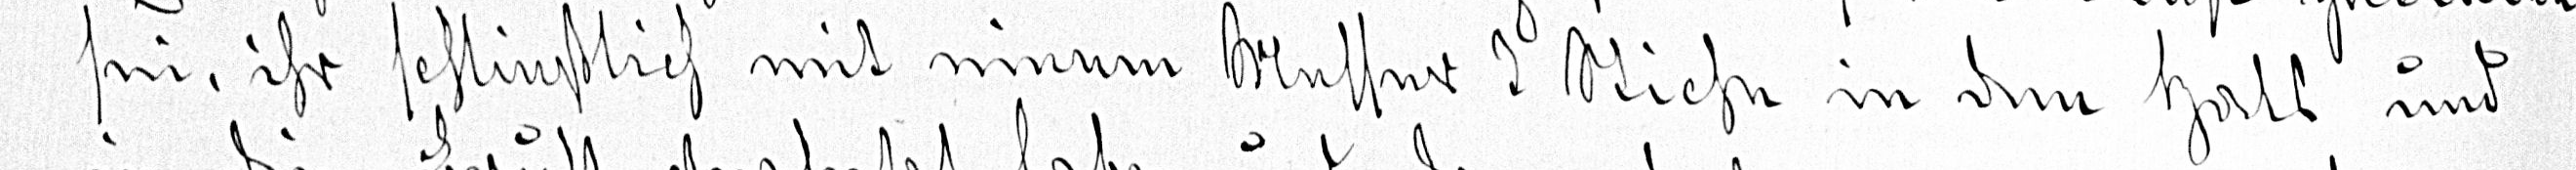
sei, ihr schließlich mit einem Messer 2 Stiche in den Hals und
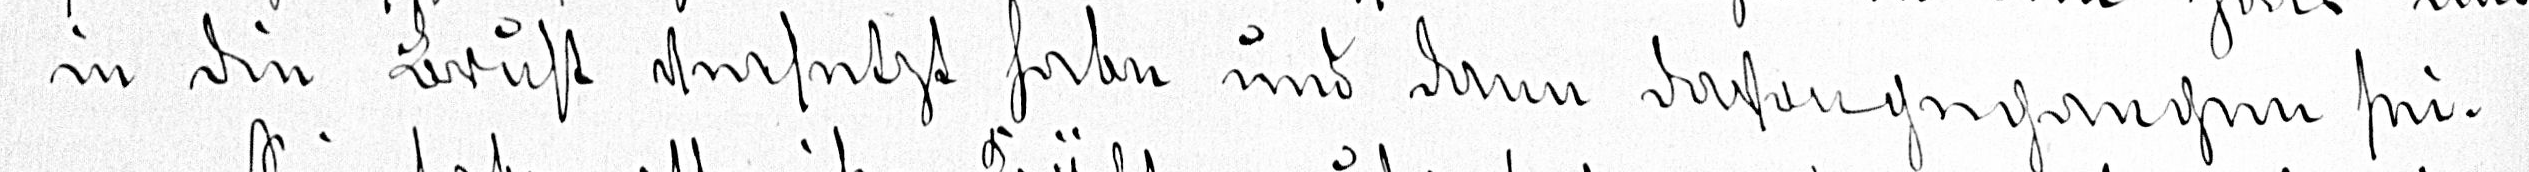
in die Brust versetzt habe und dann davongegangen sei.
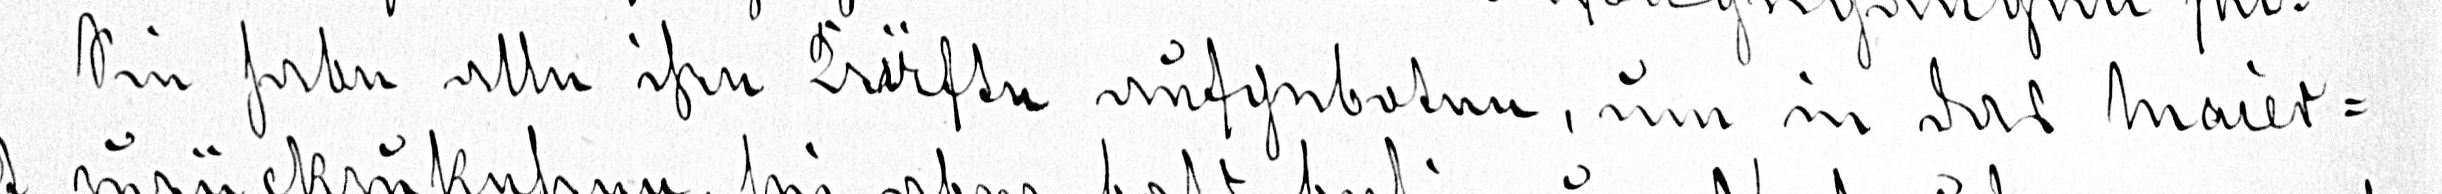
Sie habe alle ihre Kräfte aufgeboten, um in das Maier -
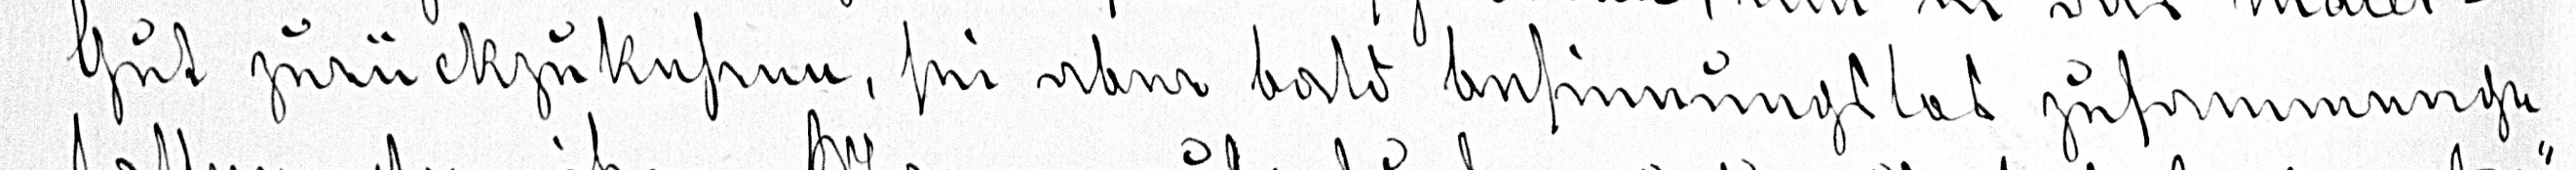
Gut zurückzukehren, sei aber bald besinnungslos zusammenge¬
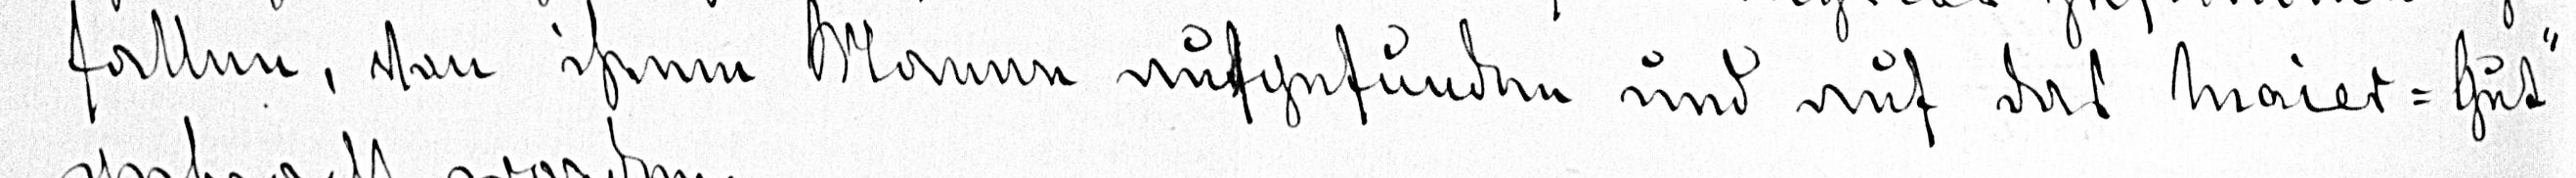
fallen, von ihrem Manne aufgefunden und auf das Meier - Gut
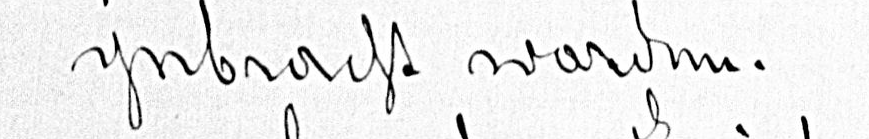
gebracht worden.
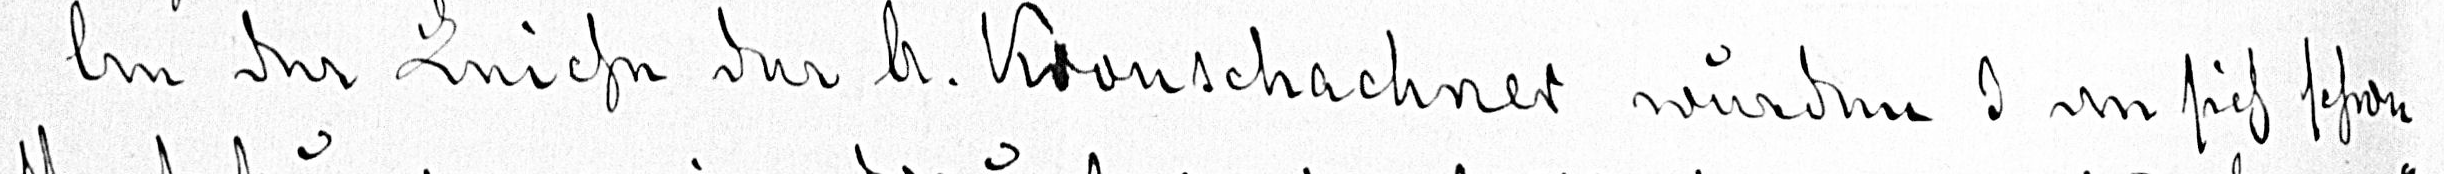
An der Leiche das A. Kronschachner wurden 3 an sich schwe¬
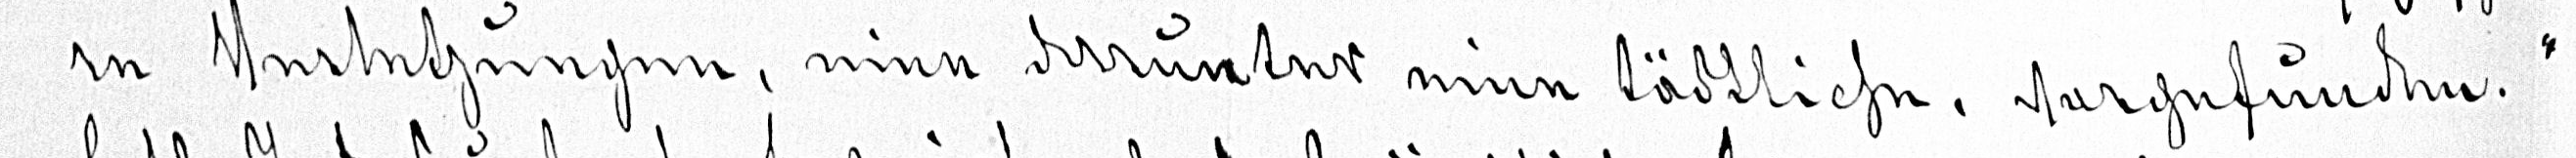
re Verletzungen, eine Darunter eine tödtliche, vorgefunden.
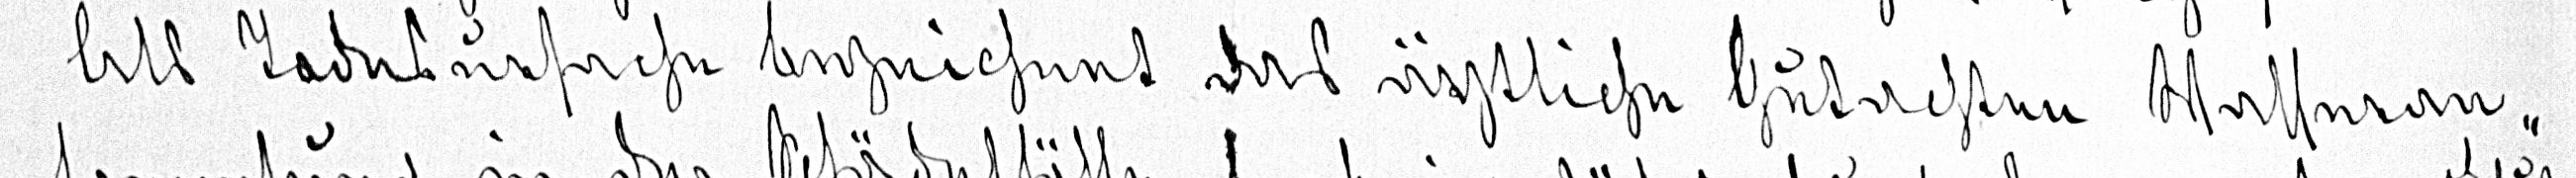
Als Todesursache bezeichnet das ärztliche Gutachten Wasseran¬
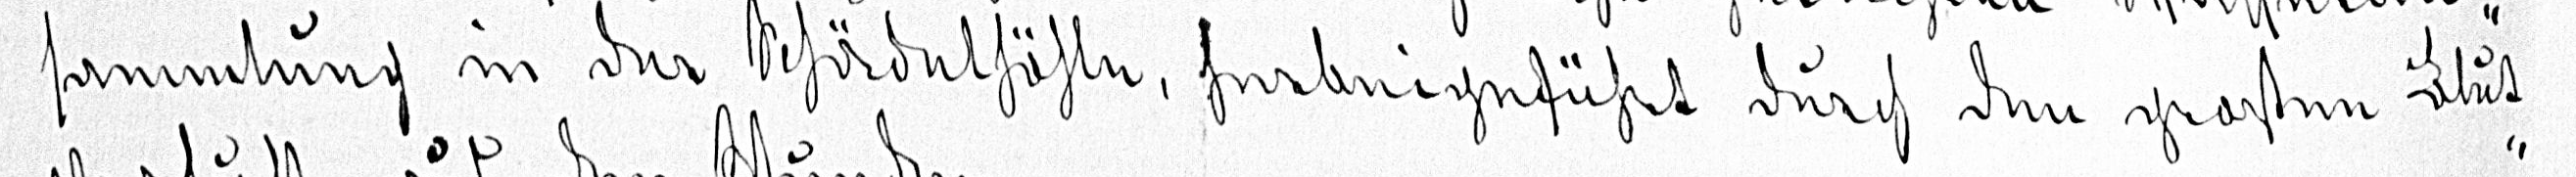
sammlung in der Schädelhöhle, Herbeigeführt durch den großen Blut¬
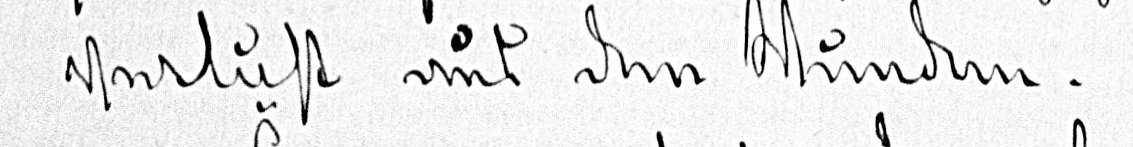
verlust aus den Wunden.
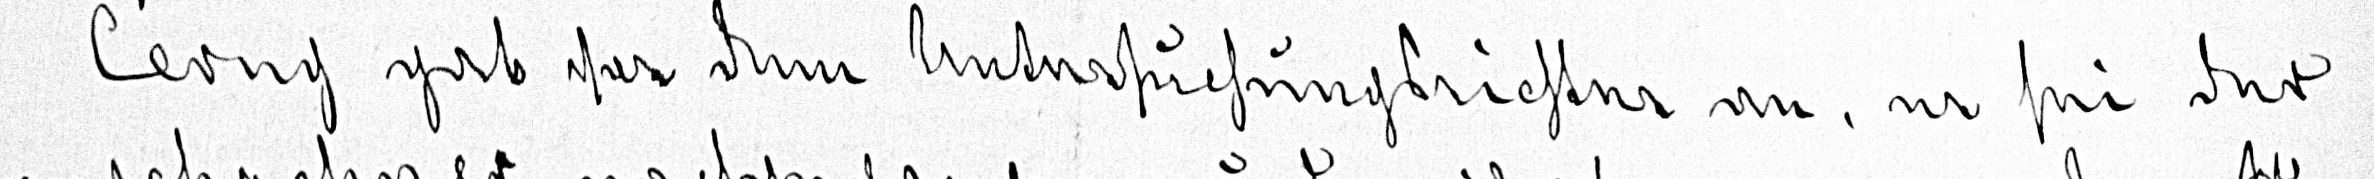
Černy gab vor dem Untersuchungsrichter an, er sei der
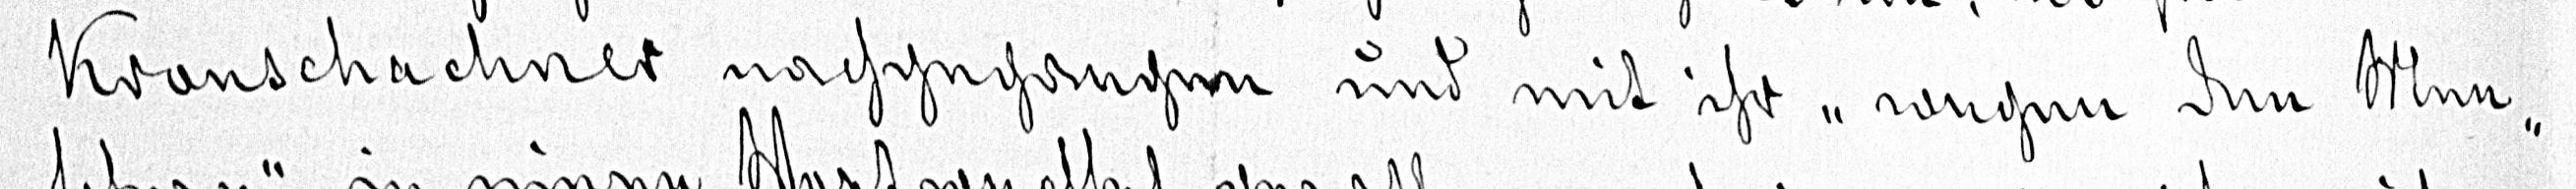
Kronschachner nachgegangen und mit ihr "wegen den Men¬
